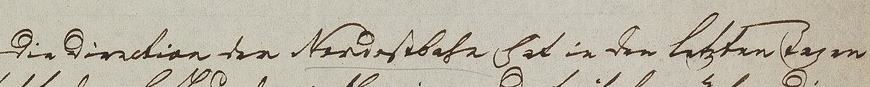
Die Direction der Nordostbahn hat in den letzten Tagen
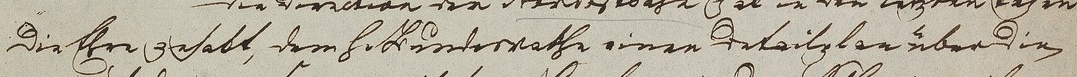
die Ehre gehabt, dem h. Bundesrathe einen Detailplan über die
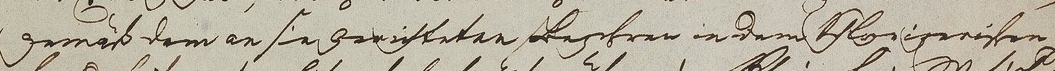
gemäß dem an Sie gerichteten Begehren in dem schweizerischen
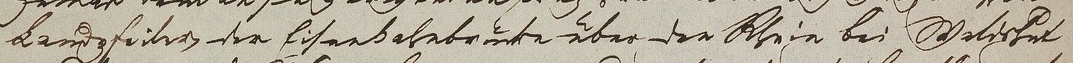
Landpfeiler der Eisenbahnbrücke über den Rhein bei Waldshut
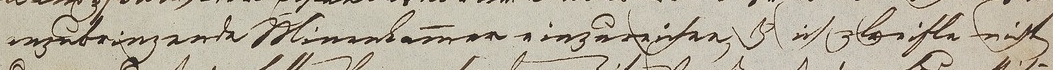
anzubringende Minenkammer einzureichen, & ich zweifle nicht
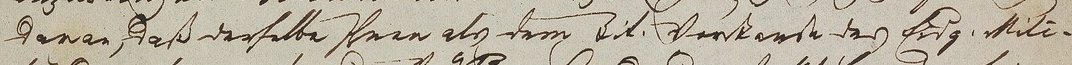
daran, daß derselbe Ihnen als dem Tit. Vorstande des Eidg. Mili-
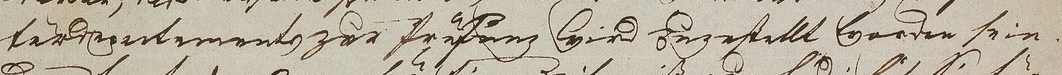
tärdepartements zur Prüfung wird zugestellt worden sein.
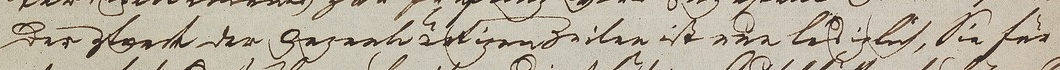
Der Zweck der gegenwärtigen Zeilen ist nun lediglich, Sie für
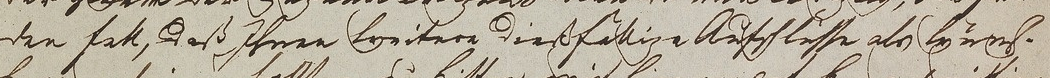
den Fall, daß Ihnen weitere dießfällige Aufschlüsse als wünsch-
